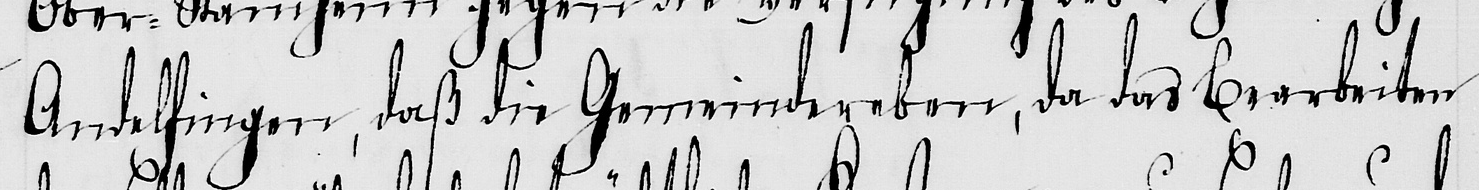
Andelfingen, daß die Gemeindereben, da das Bearbeiten
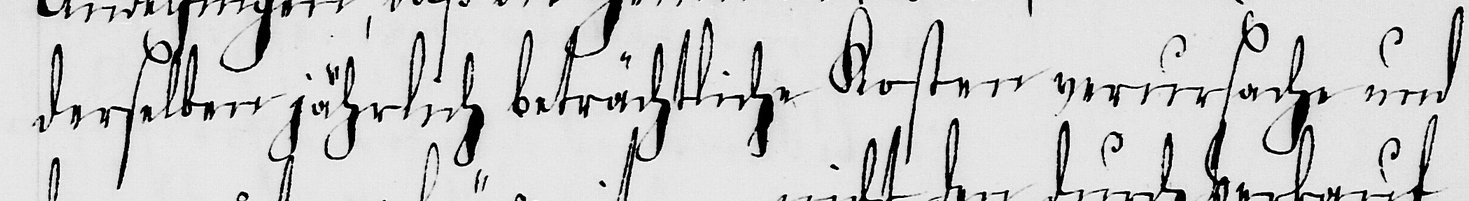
derselben jährlich beträchtliche Kosten verursache und
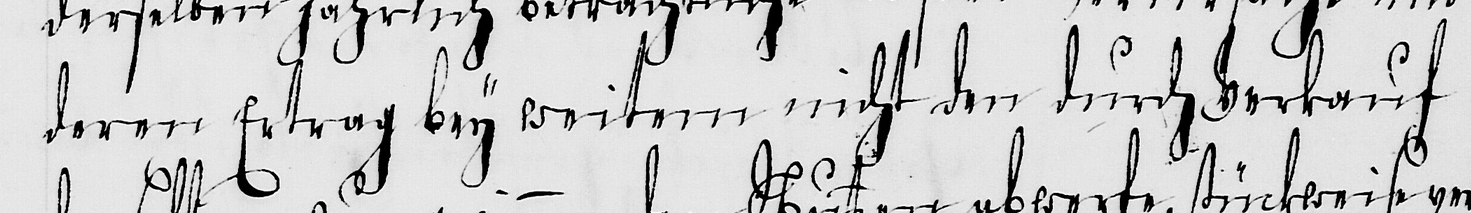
deren Ertrag bey weitem nicht den durch Verkauf
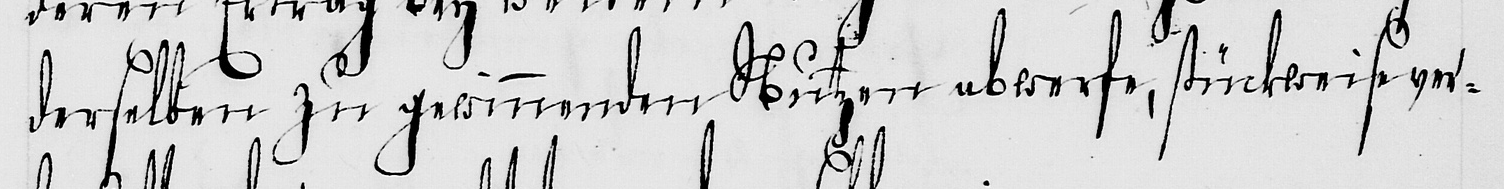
derselben zu gewinnenden Nutzen abwerfe, stückweise ver¬
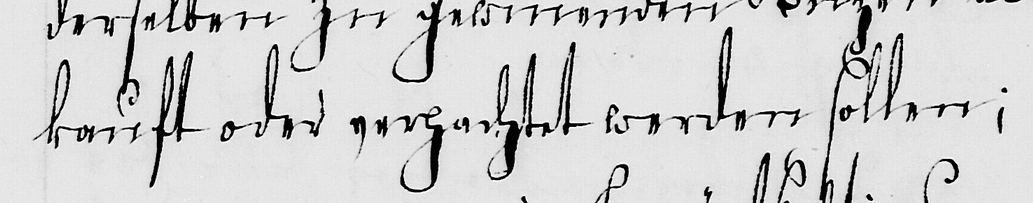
kauft oder verpachtet werden sollen;
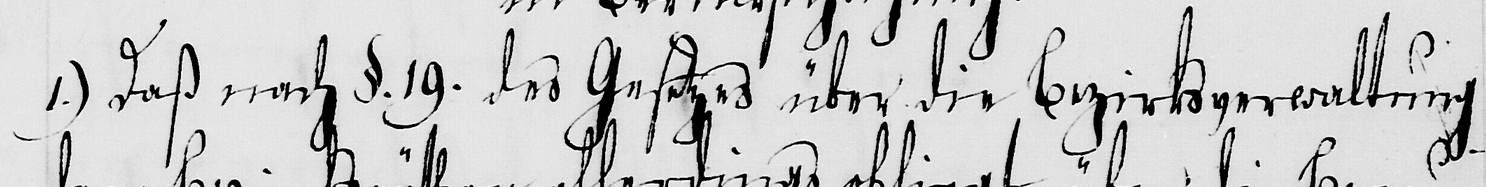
1.) Daß nach §. 19. des Gesetzes über die Bezirksverwaltung
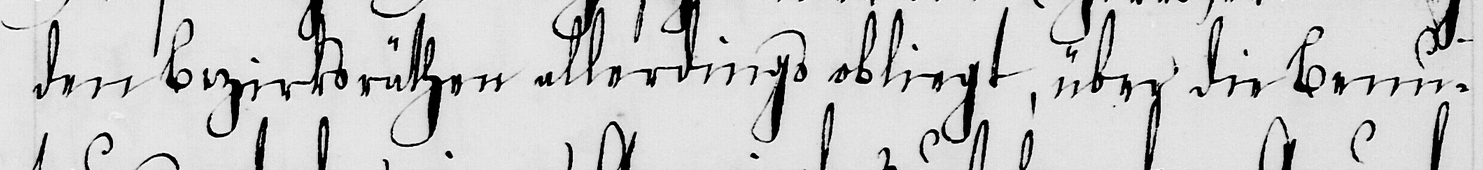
den Bezirksräthen allerdings obliegt, über die Benu¬
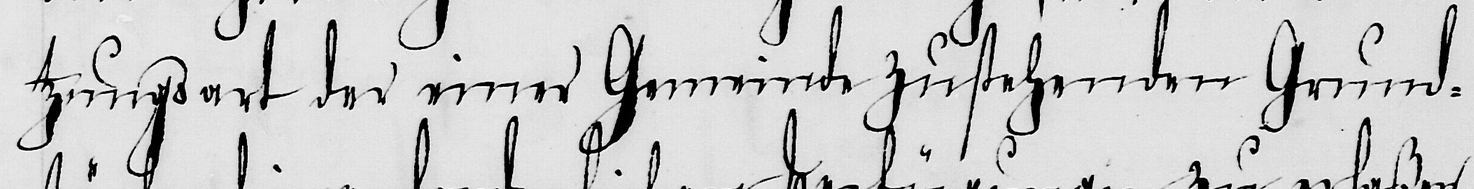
tzungsart der einer Gemeinde zustehenden Grund¬
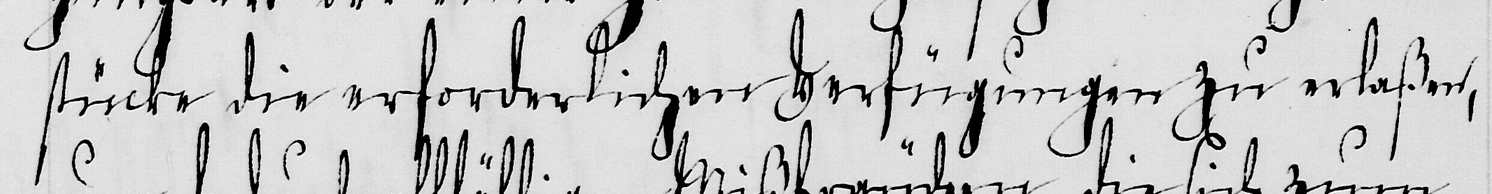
stücke die erforderlichen Verfügungen zu erlaßen,
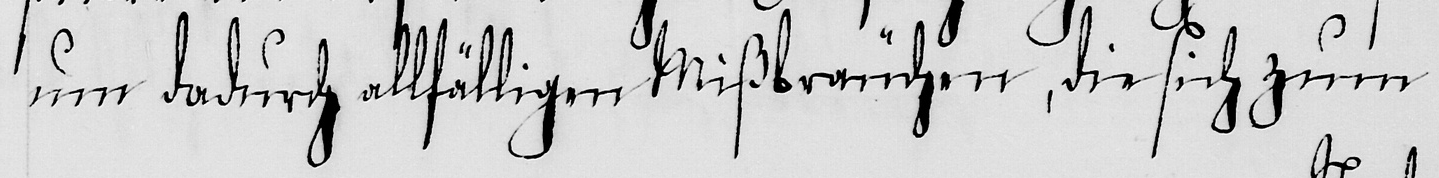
um dadurch allfälligen Mißbräuchen, die sich zum
